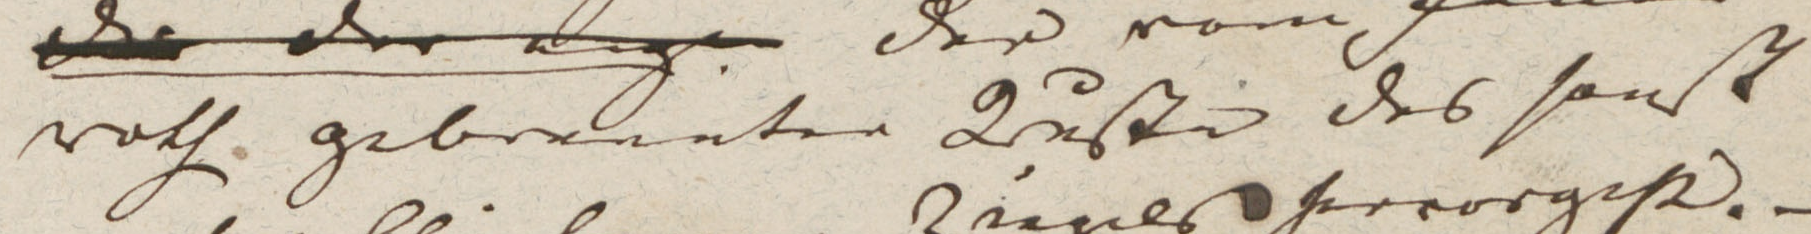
roth gebrannten Kruste des sonst
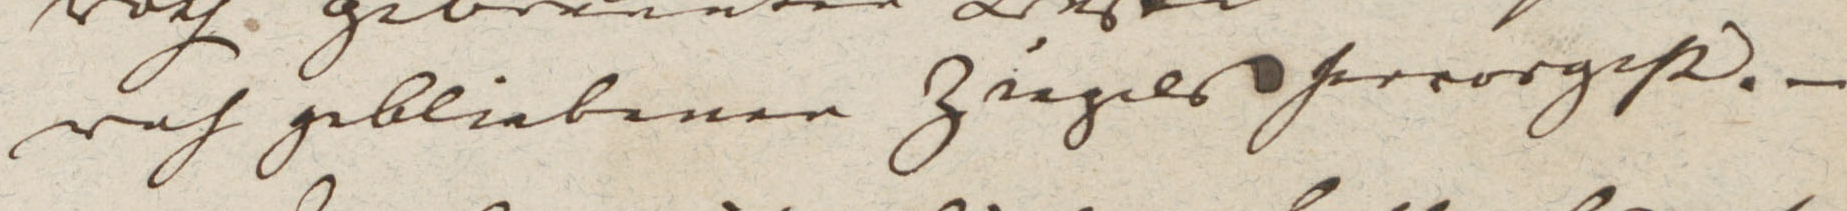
roh gebliebenen Ziegels hervorgeht. –
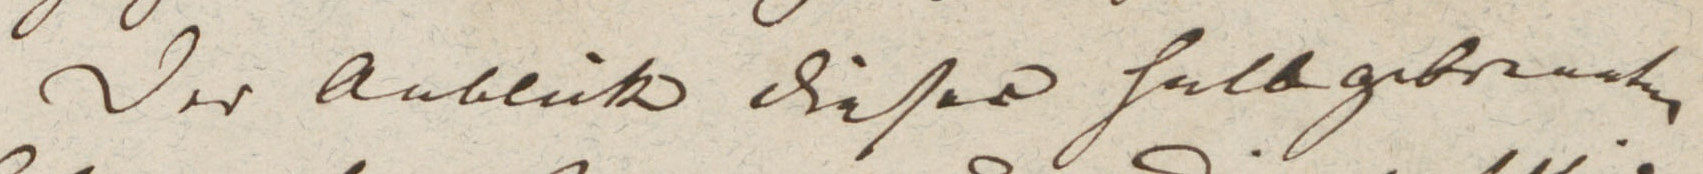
Der Anblick dieser halb gebrannten
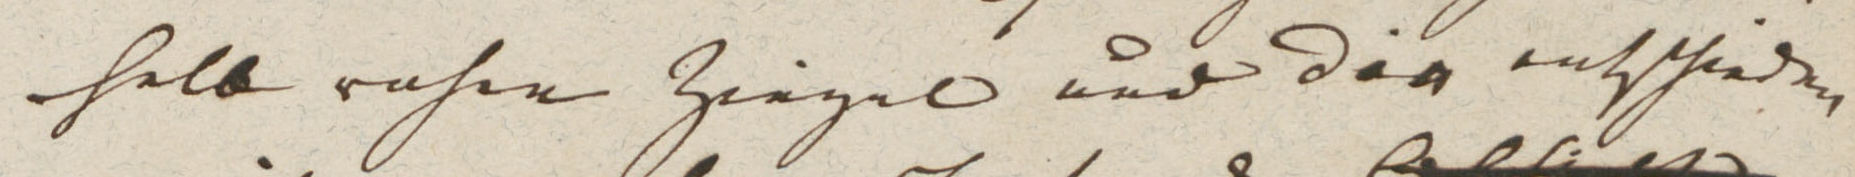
halb rohen Ziegel und dieer entschieden
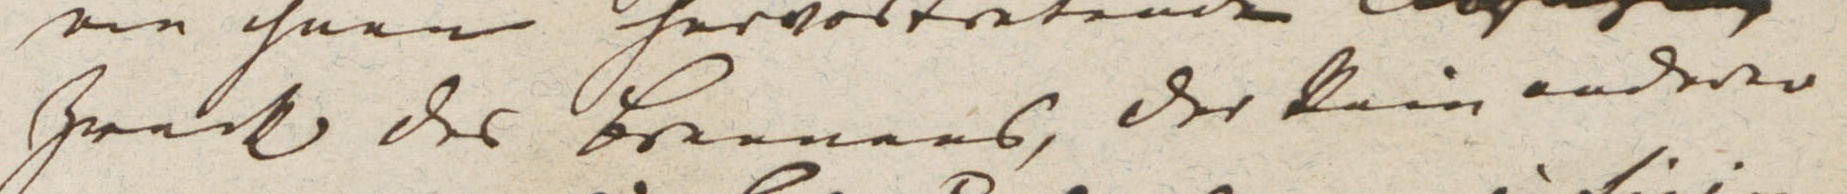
Zweck des Brennens, der kein anderer
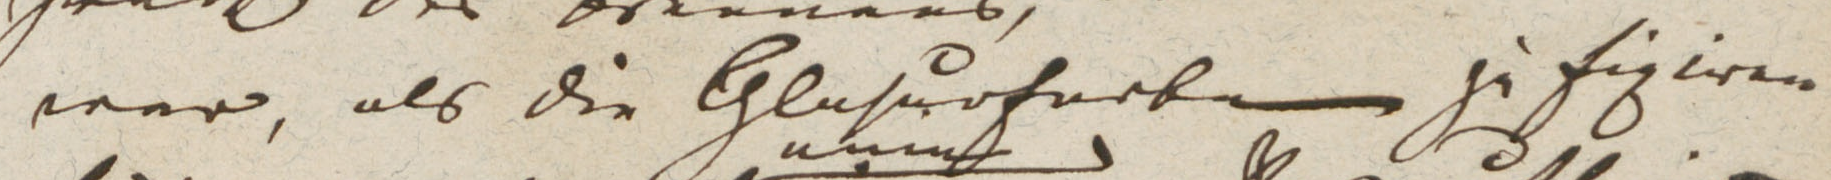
war, als die Glasurfarbe zu fixiren
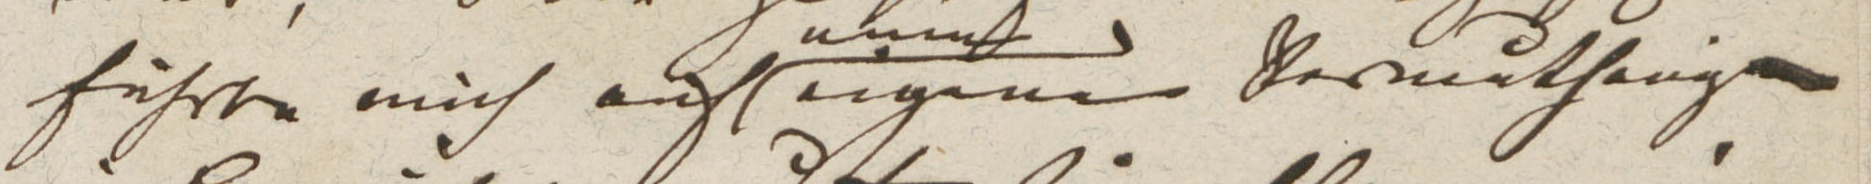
führte mich auf eine eigene Vermuthungen
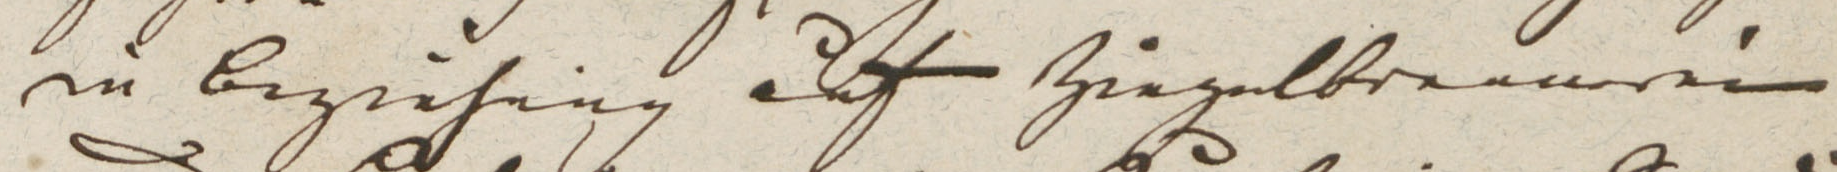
in Beziehung auf Ziegelbrennerei
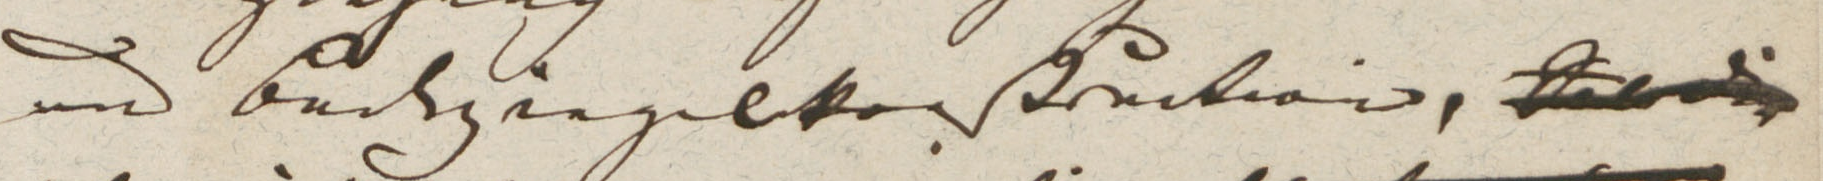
und Backziegelkonstruction, S die
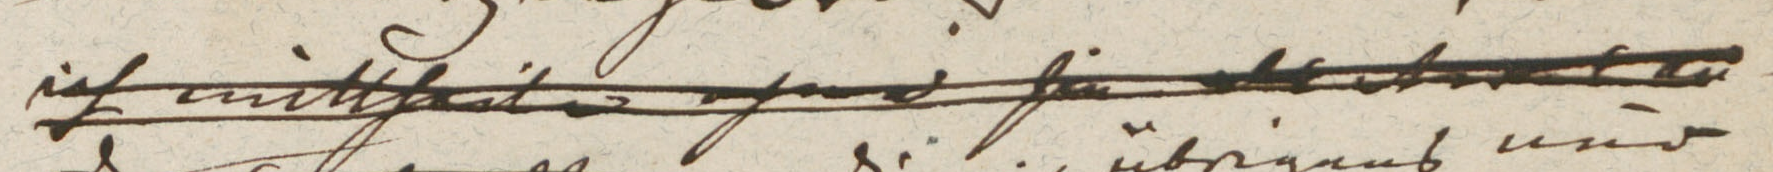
ich mittheile ohne sie als etwas an-
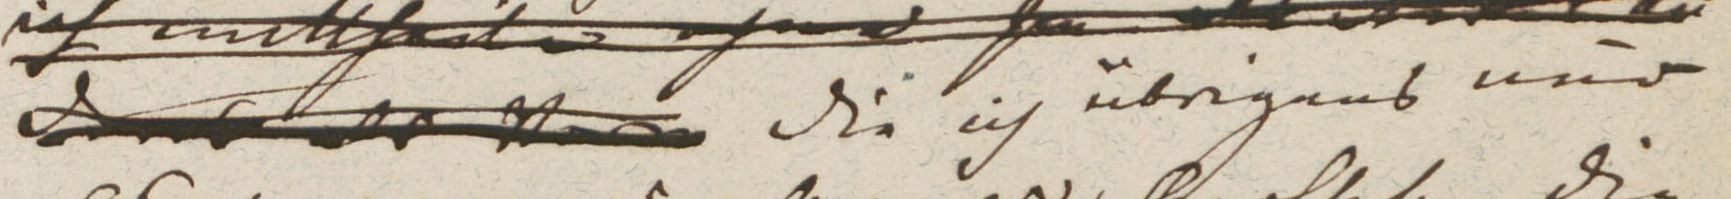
deres als V die ich übrigens nur
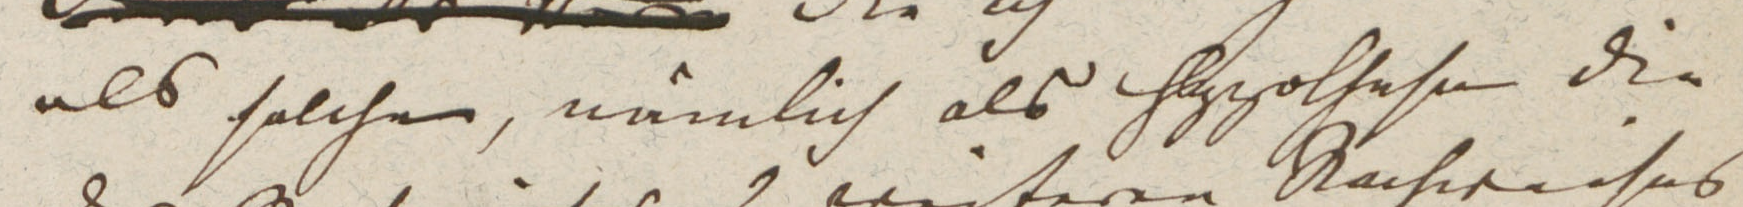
als solche, nämlich als Hypothese die
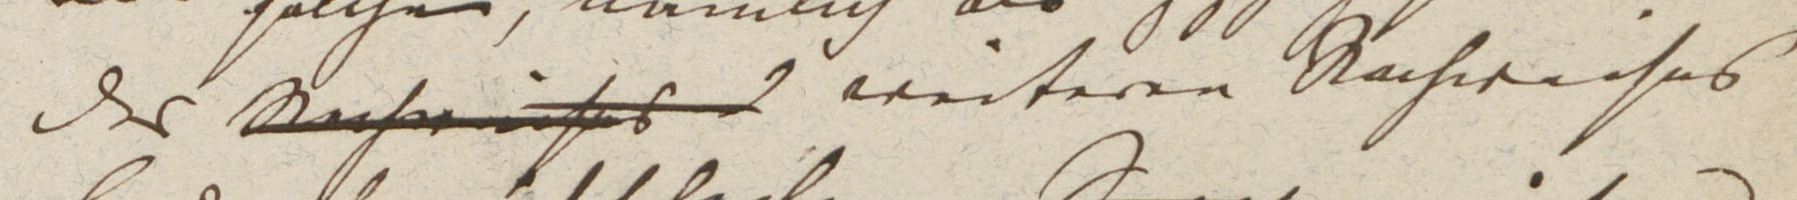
des Nachweises weiteren Nachweises
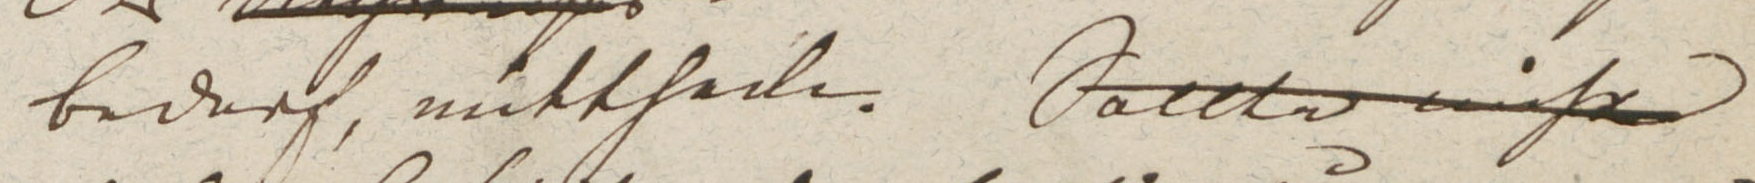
bedarf, mittheile. Sollte nicht
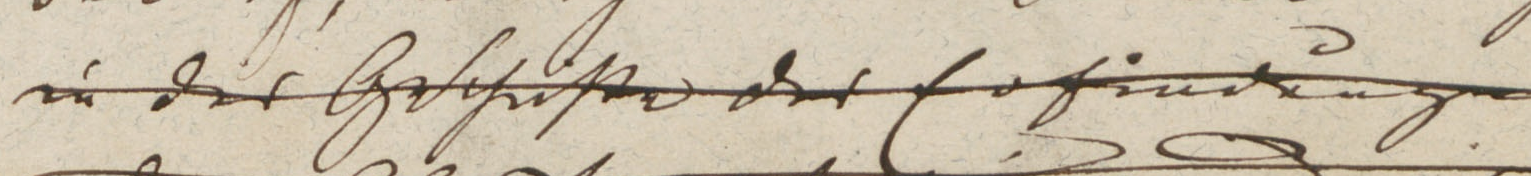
in der Geschichte der Erfindungen
